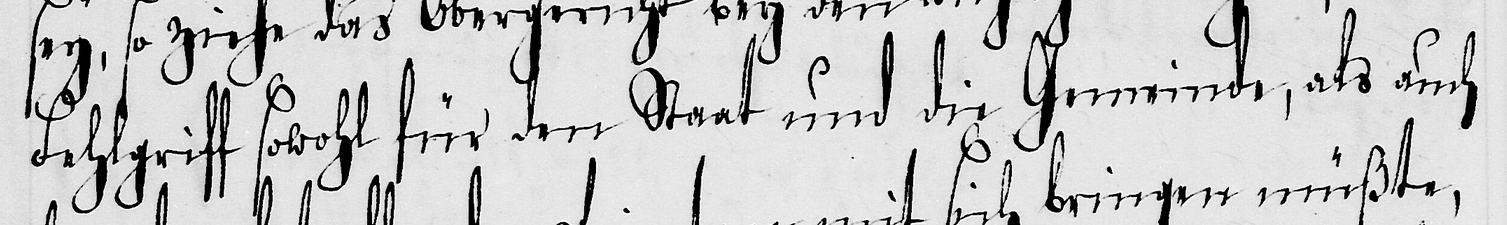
Fehlgriff sowohl für den Staat und die Gemeinde, als auch
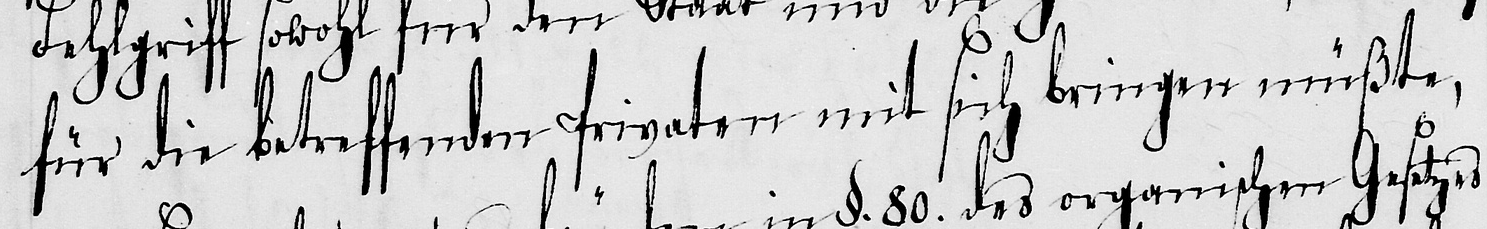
für die betreffenden Privaten mit sich bringen müßte,
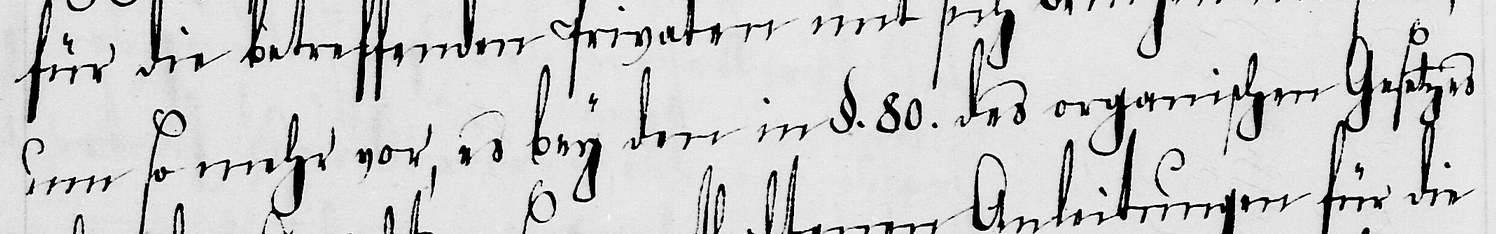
um so mehr vor, es bey den in §.80. des organischen Gesetzes
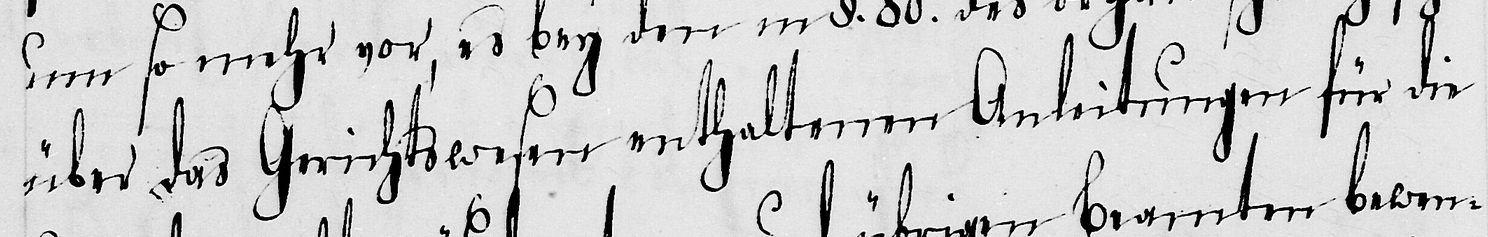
über das Gerichtswesen enthaltenen Anleitungen für die
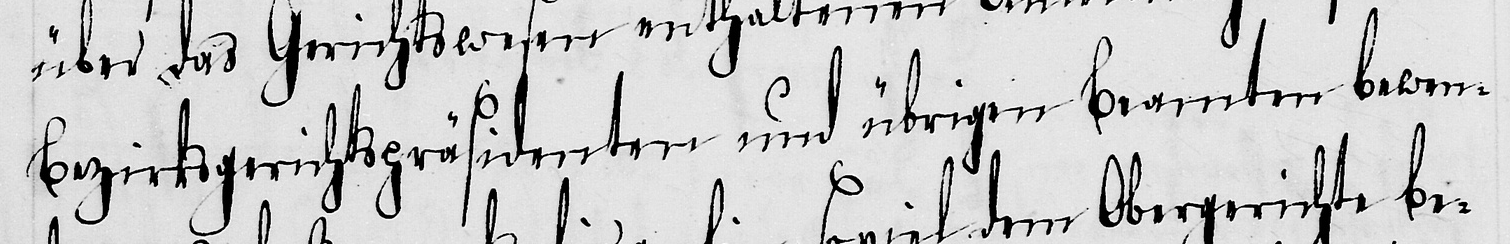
Bezirksgerichtspräsidenten und übrigen Beamten bewan¬
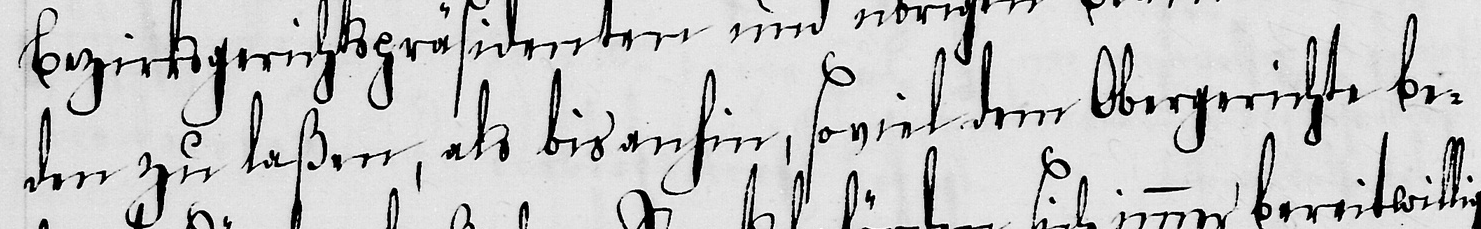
den zu laßen, als bis anhin, so viel dem Obergerichte be¬
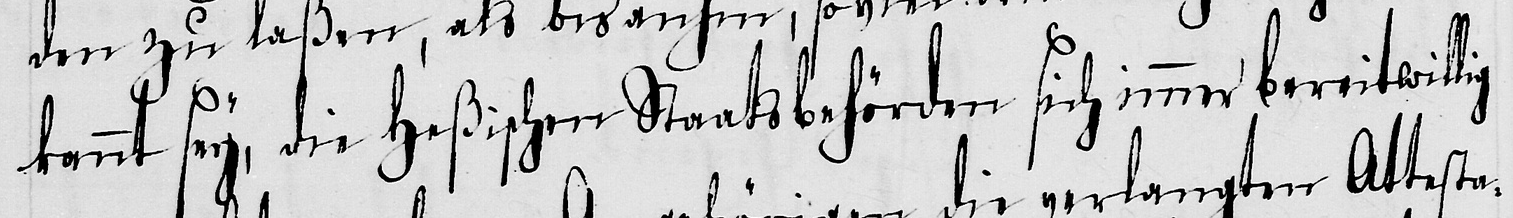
kannt sey, die Heßischen Staatsbehörden sich immer bereit¬
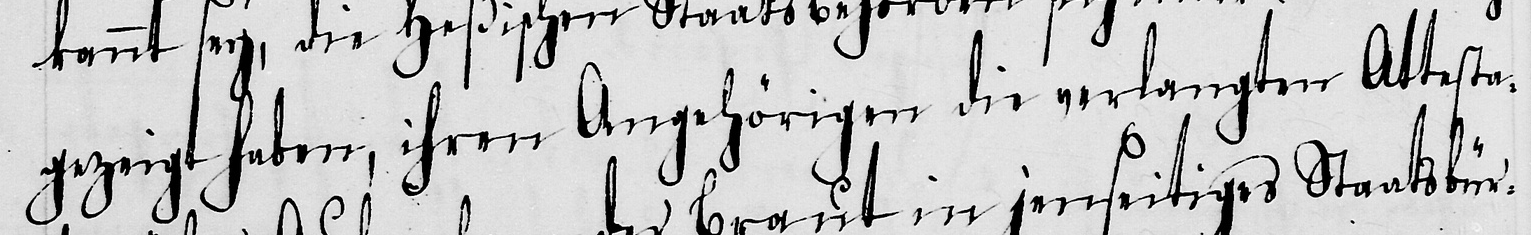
gezeigt haben, ihren Angehörigen die verlangten Attest¬
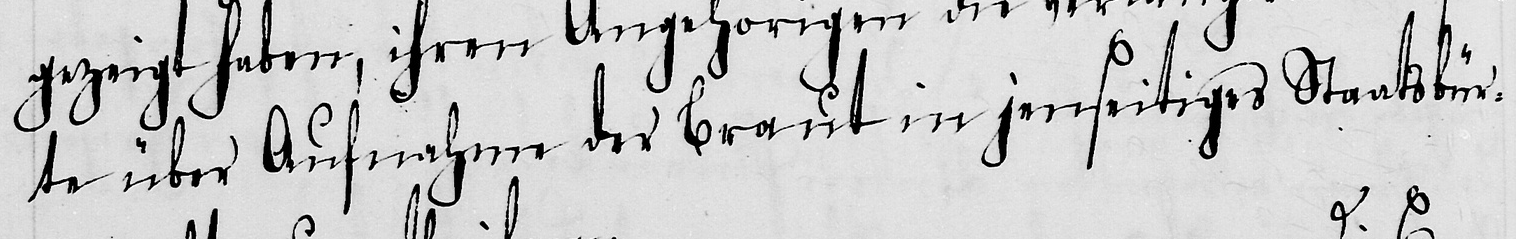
ate über Aufnahme der Braut in jenseitiges Staatsbür¬
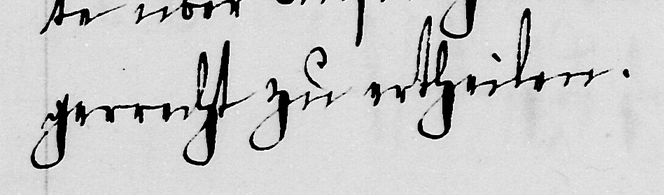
gerrecht zu ertheilen.
